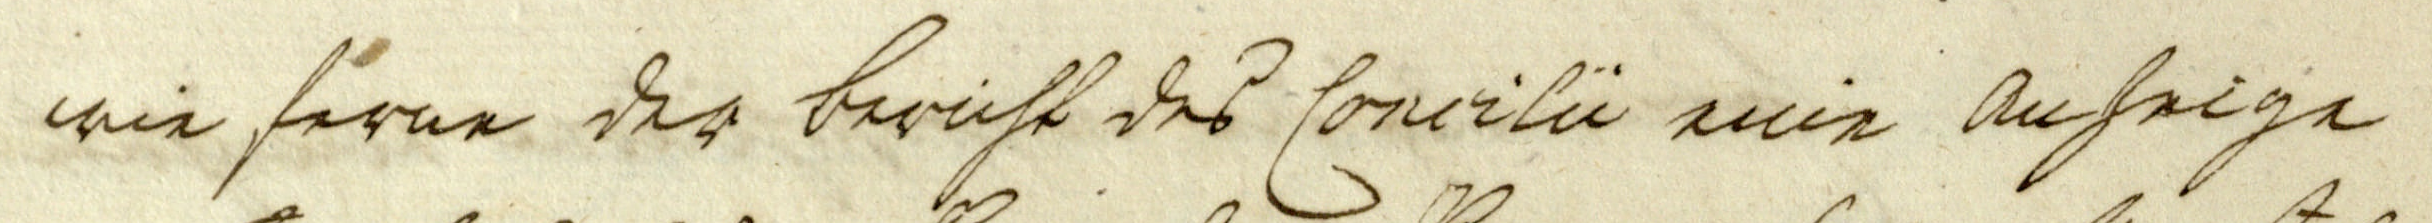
wie ferne der Bericht des Concilii eine Anzeige
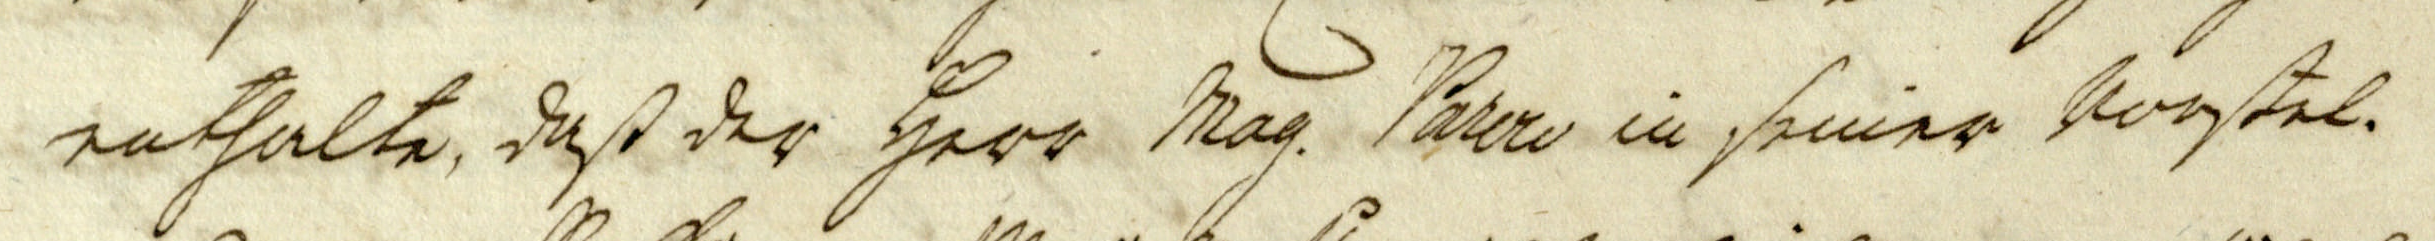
enthalte, daß der Herr Mag. Parow in seiner Vorstel¬
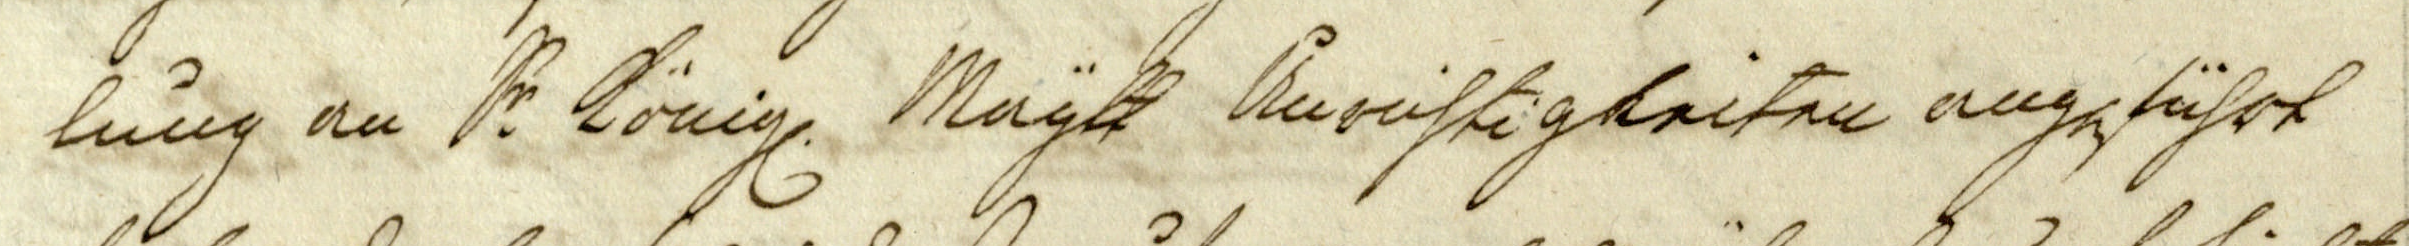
lung an Sr. Königl. Maÿtt. Unrichtigkeiten angeführt
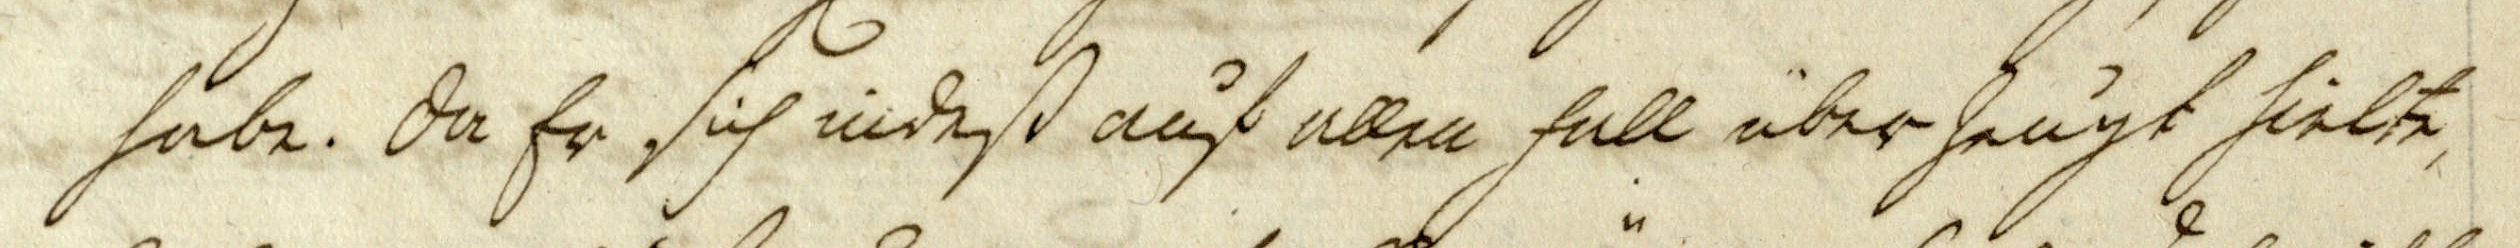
habe. Da Er sich indeß auf allen Fall überhaupt hielte,
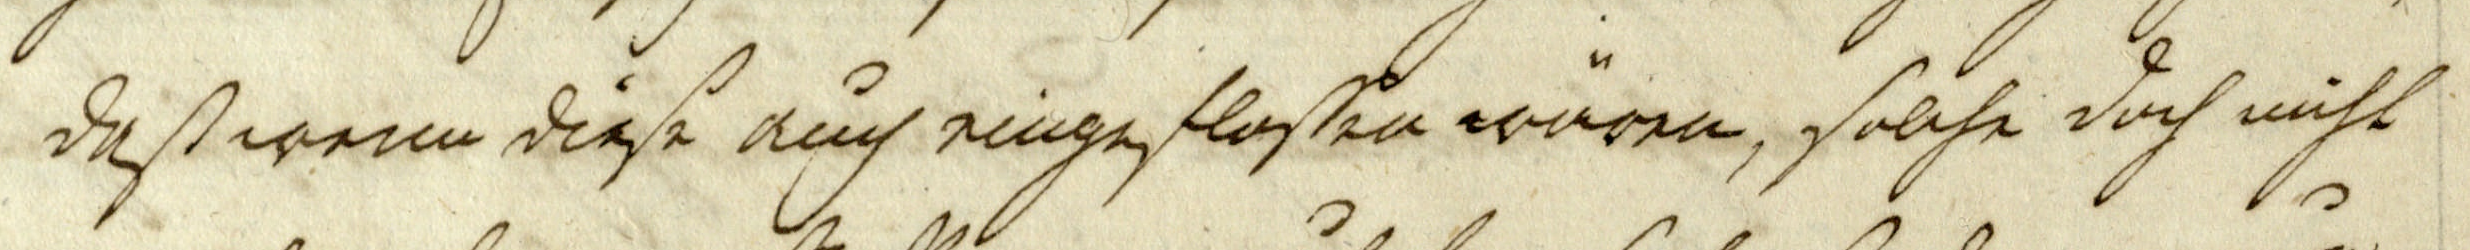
daß wenn diese auch eingeflossen wären, solche doch nicht
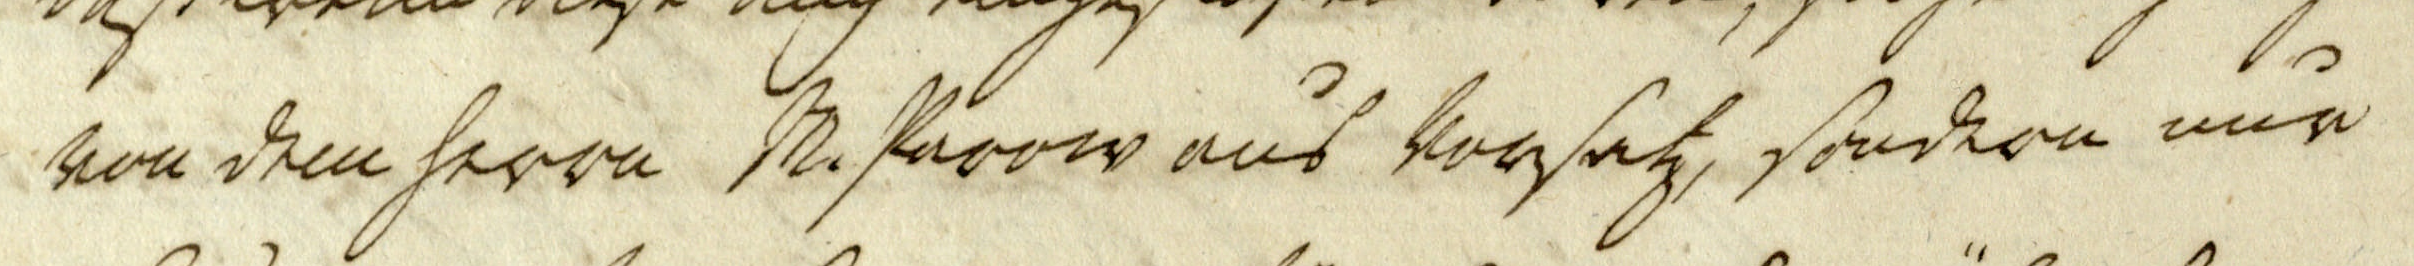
von dem herrn M. Parow aus Vorsatz, sondern nur
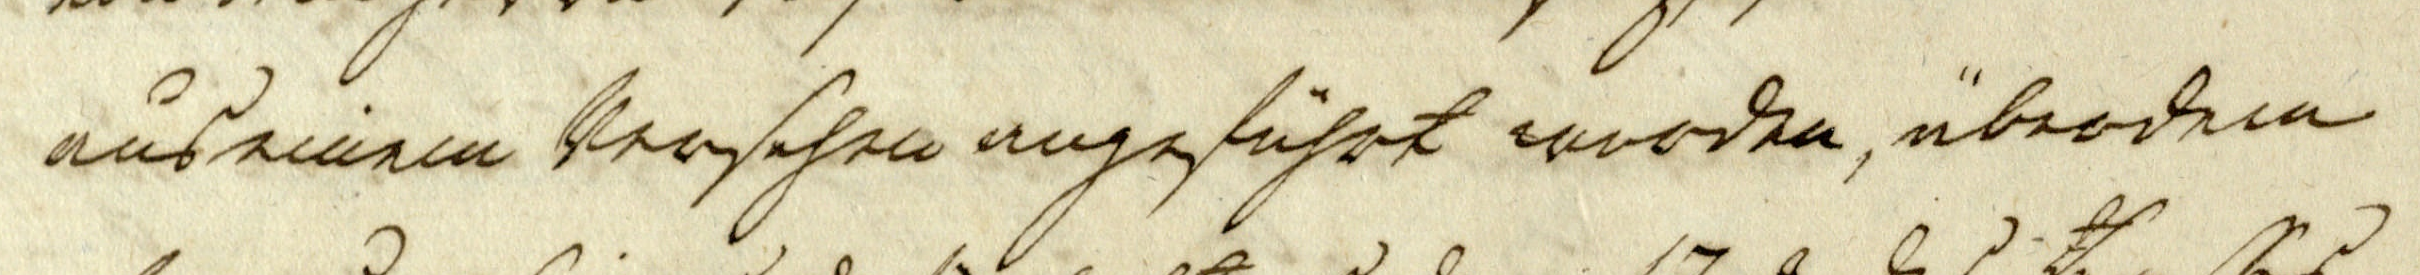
aus einem Versehen angeführt worden, überdem
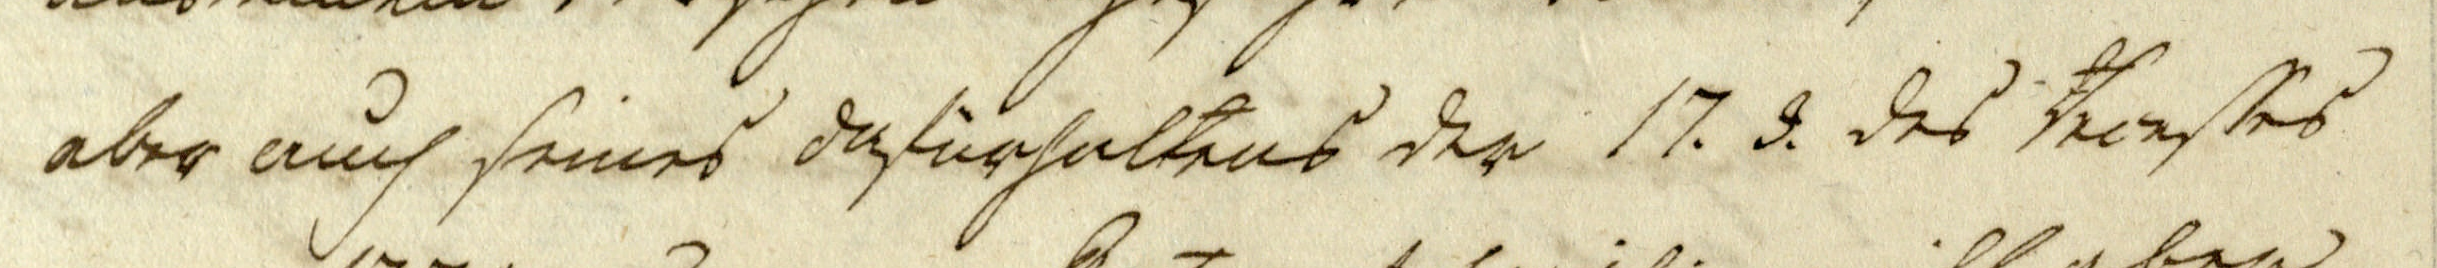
aber auch seines dafürhaltens der 17. § des Recesses
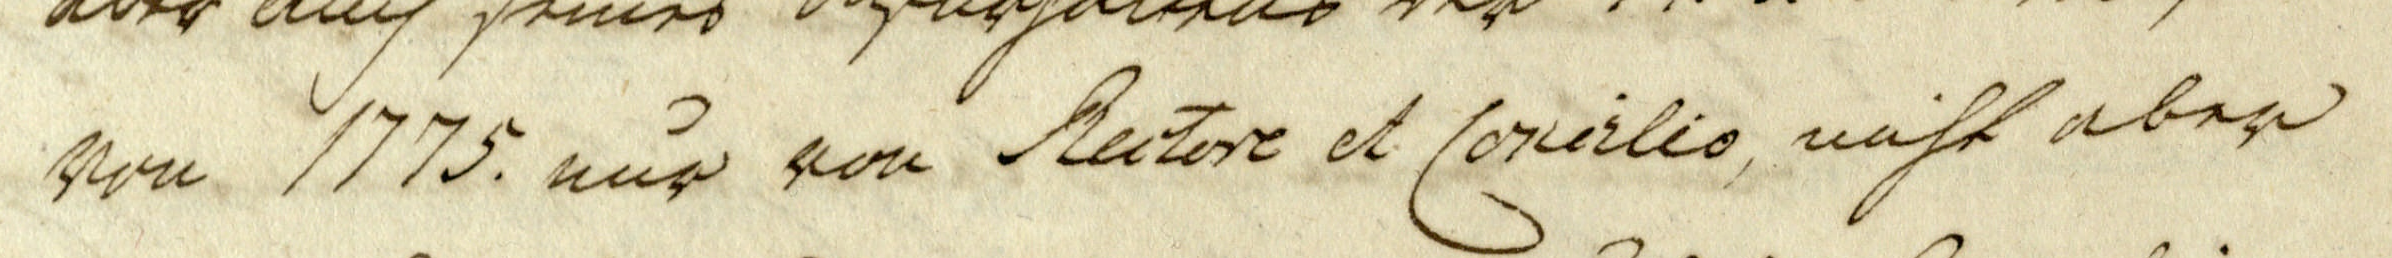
von 1775. nur von Rectore et Concilio, nicht aber
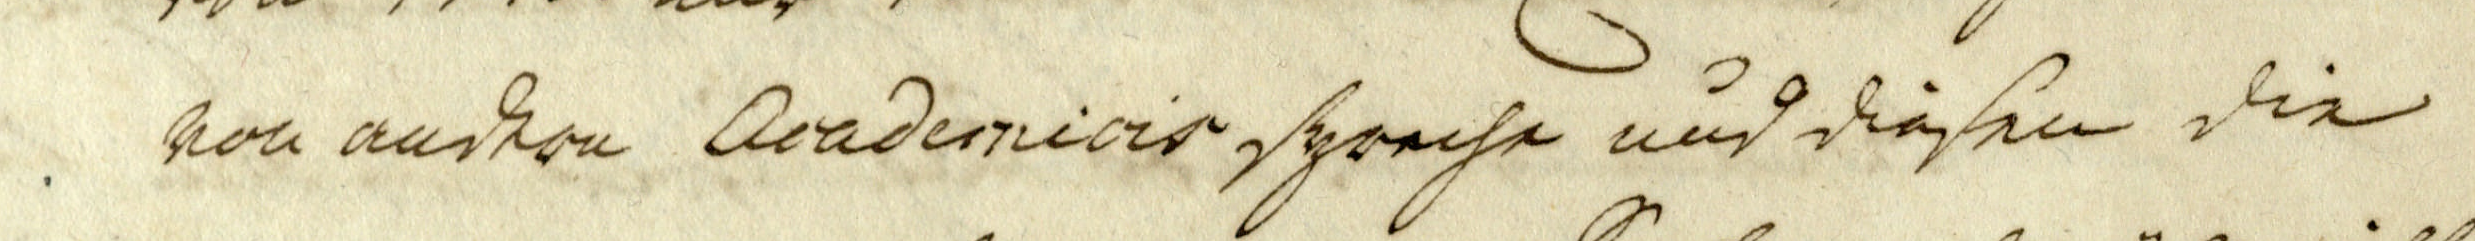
von andern Academicis spreche und diesen die
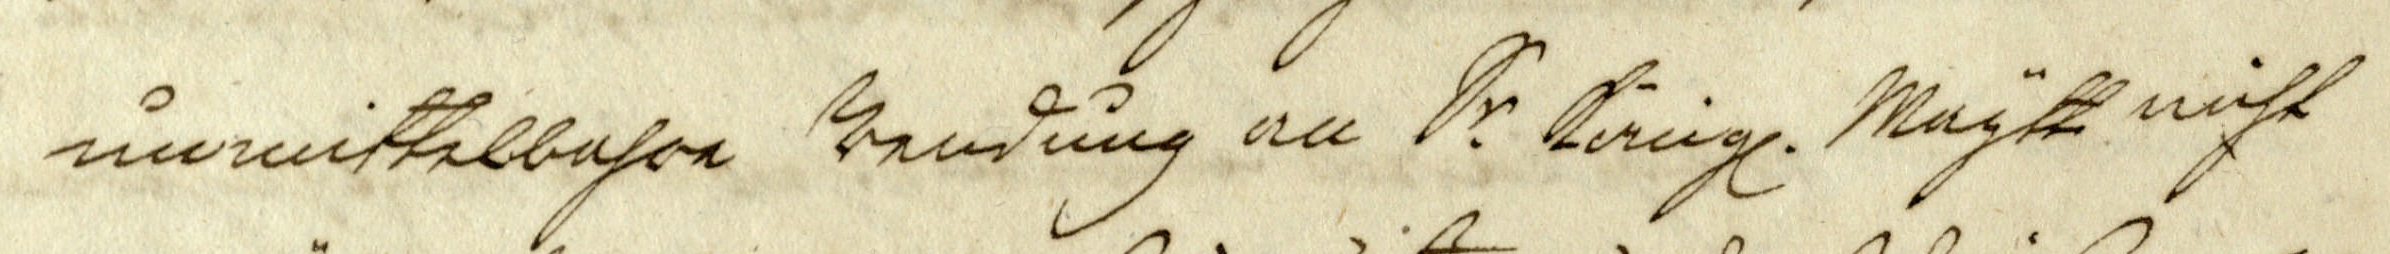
unmittelbahre Wendung an Sr. Königl. Maÿtt. nicht
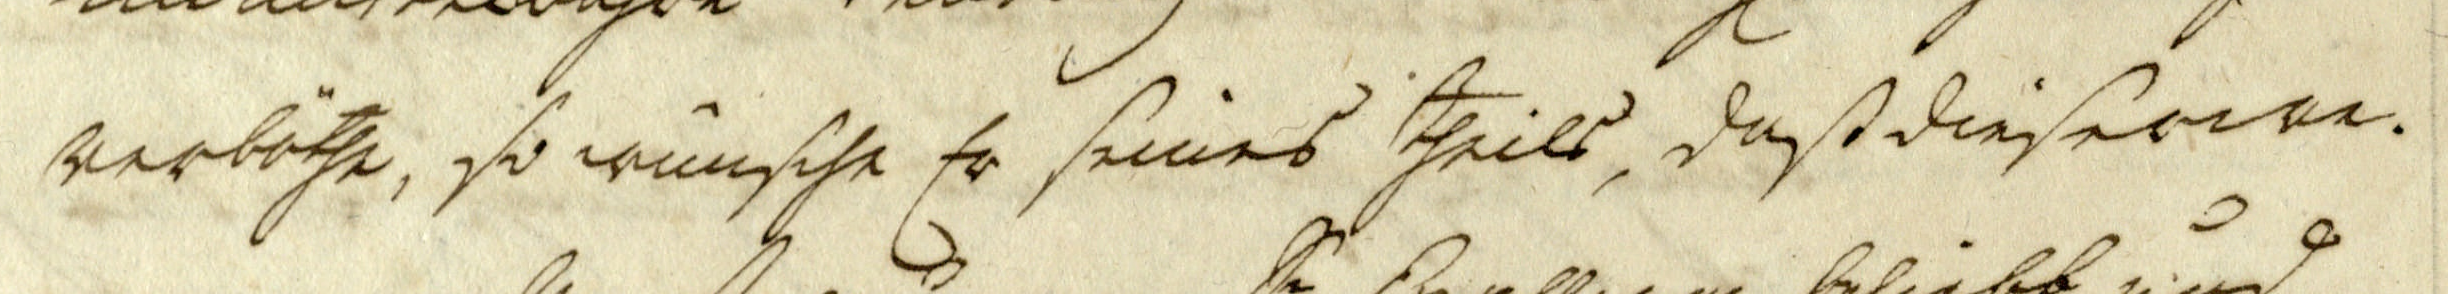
verböthe, so wünsche Er seines theils daß dieserwe¬
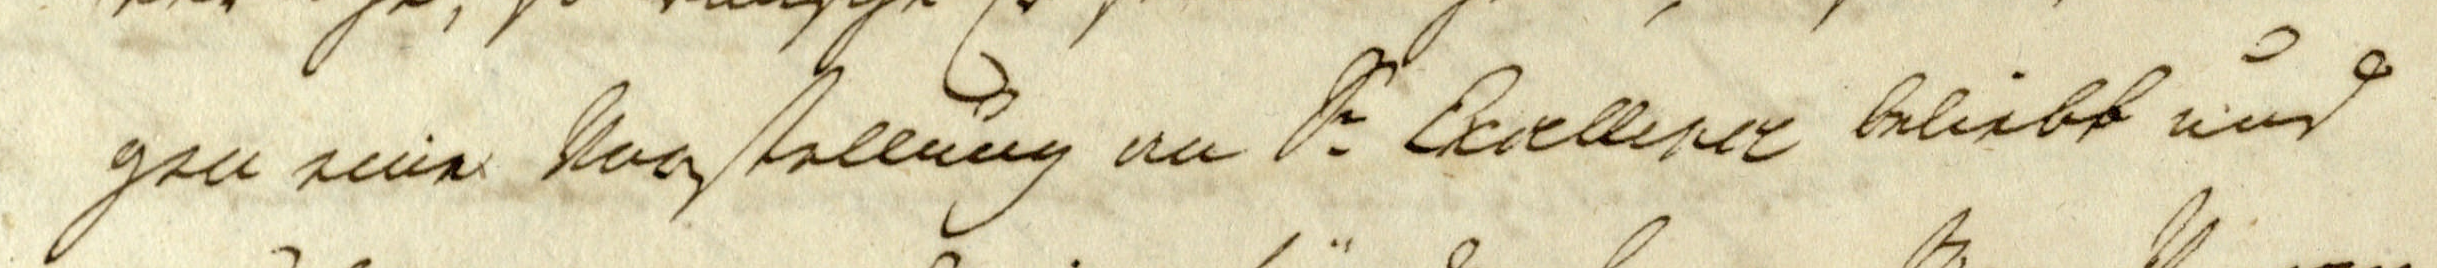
gen eine Vorstellung an Sr. Excellence beliebt und
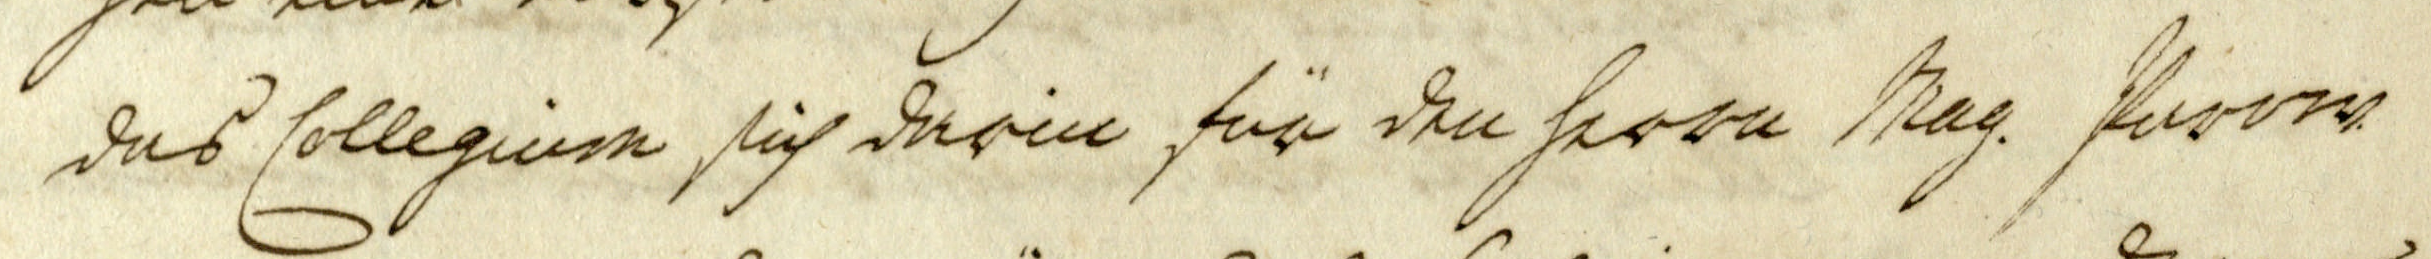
das Collegium sich darin für den herrn Mag. Parow
